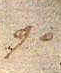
90
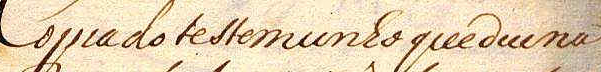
Copiado testemunho que deu na
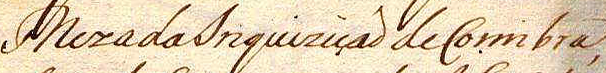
Meza da Inquiziçaõ de Coimbra,
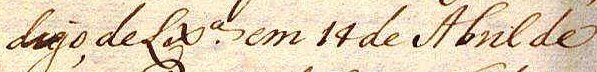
digo, de Lx.a em 14 de Abril de
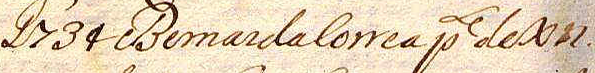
1734 Bernarda Correa pte de XN.
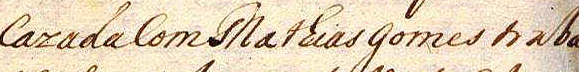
Cazada Com Mathias gomes traba
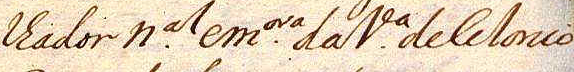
lhador n.al e m.ora da V.a de Celorico
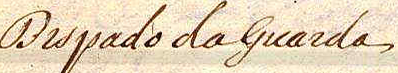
Bispado da Guarda
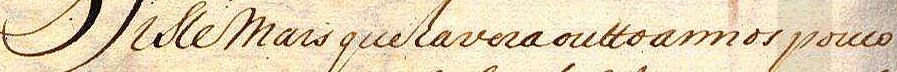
Disse mais que havera outto annos pouco
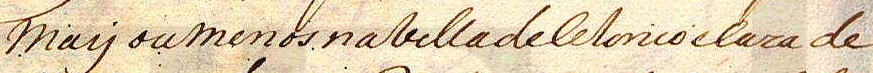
mais ou menos na Villa de Celorico e Caza de
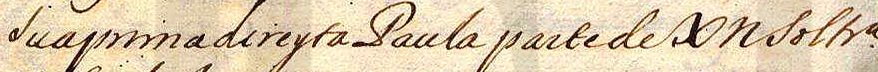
sua prima direyta Paula parte de XN soltr.a
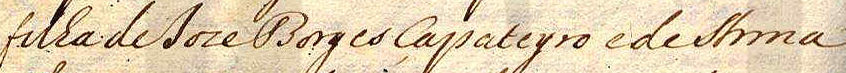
filha de Ioze Borges Çapateyro e de Anna
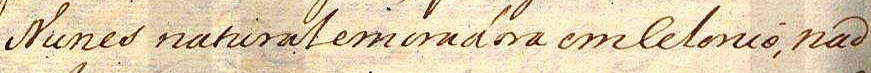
Nunes natural e moradora em Celorico, naõ
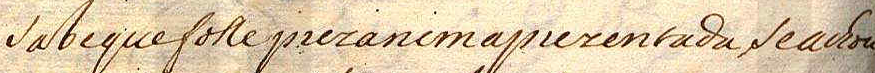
sabe que fosse preza nem aprezentada, se achou
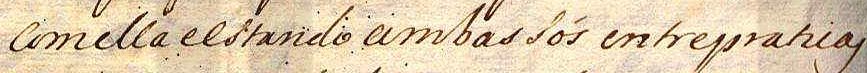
com ella e estando ambas sós entre praticas
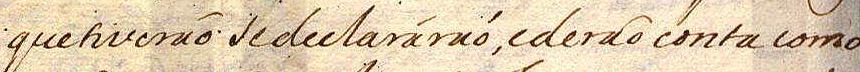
que tiveraõ se declaráraõ, e deraõ conta como
